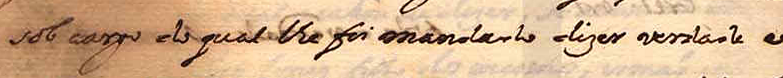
sob cargo do qual lhe foi mandado dizer verdade e
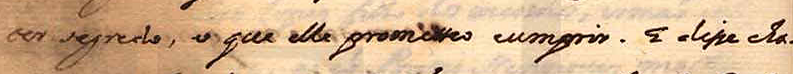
ter segredo, o que elle prometteo cumprir. E disse cha
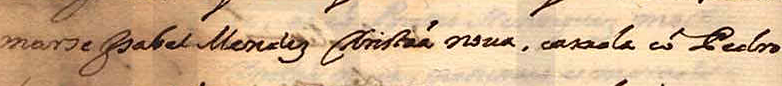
marse Jsabel Mendez Christaã noua, casada cō Pedro
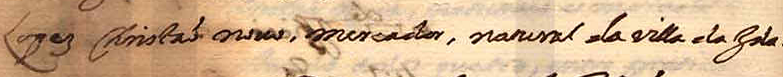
Lopez Christaõ nouo, mercador, natural da villa da Jda
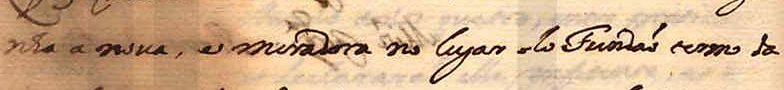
nha a noua, e moradora no lugar do Fundaõ termo da
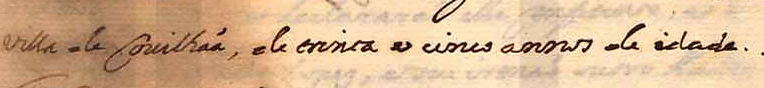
villa de Couilhaã, de trinta e cinco annos de idade.
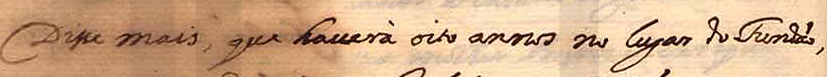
Disse mais, que hauerà oito annos no lugar do Fundão,
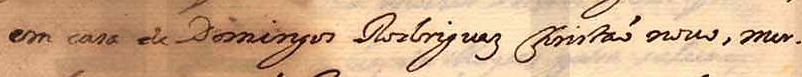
em casa de Domingos Rodriguez Christaõ nouo, mer
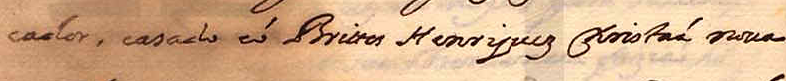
cador, casado cō Brittes Henriquez Christaã noua
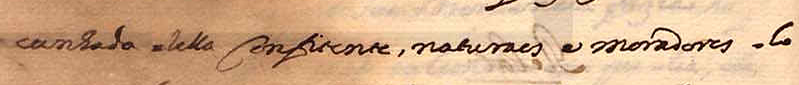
cunhada della Confitente, naturaes e moradores do
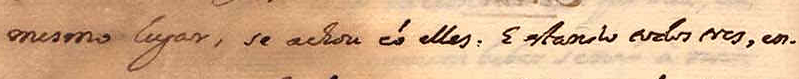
mesmo lugar, se achou cō elles: E estando todos tres, en
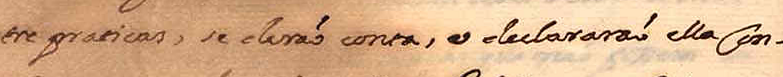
tre praticas, se deraõ conta, e declararaõ ella Con
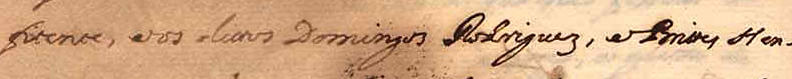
fitente, e os dittos Domingos Rodriguez, e Brittes Hen
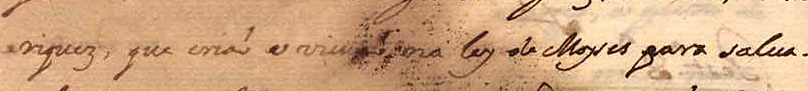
riquez, que criaõ e viuiaõ na ley de Moyses para salua
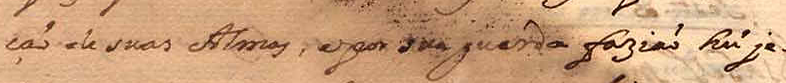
çaõ de suas Almas, e por sua guarda faziaõ hū je
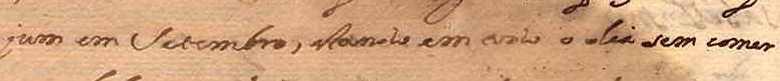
jum em Setembro, estando em todo o dia sem comer
